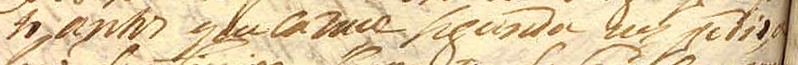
to antes que cazaçe segunda ves pedio a
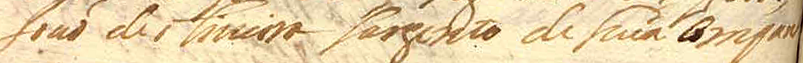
Joaõ de oliueira Sargento de huā compan
